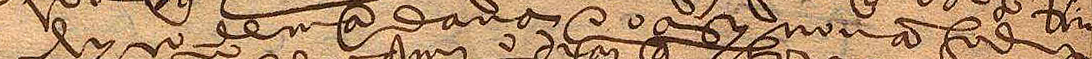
deyro demādaua e o asynou cō ho dito
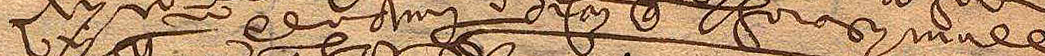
vygro e eu Anto diaz q̄ hora syruo de
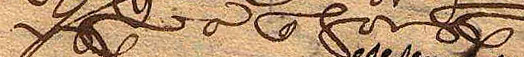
esp̄vā q̄ ho esp̄
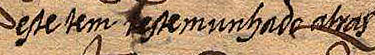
este tem testemunhado atras
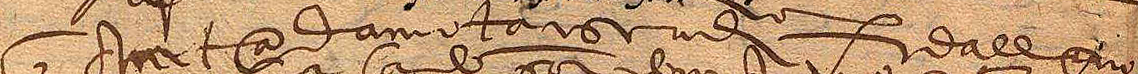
item Amtā da mota escudro fidallguo
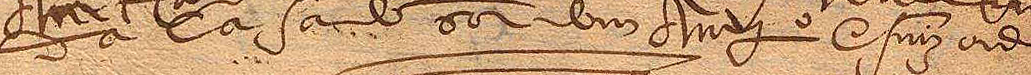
da Casa do sōr dom Amto e Juiz ordj
